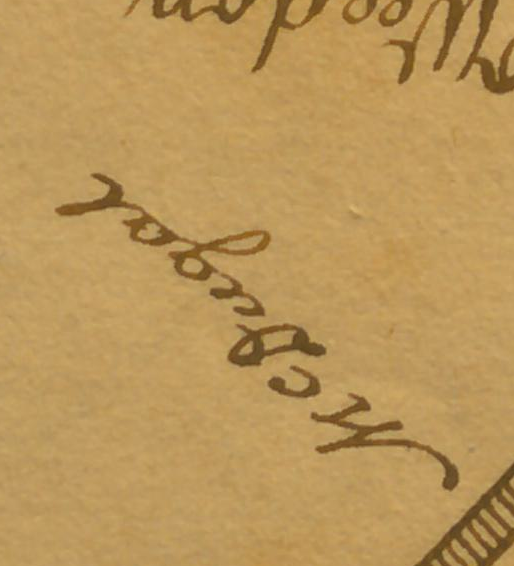M^cDugal
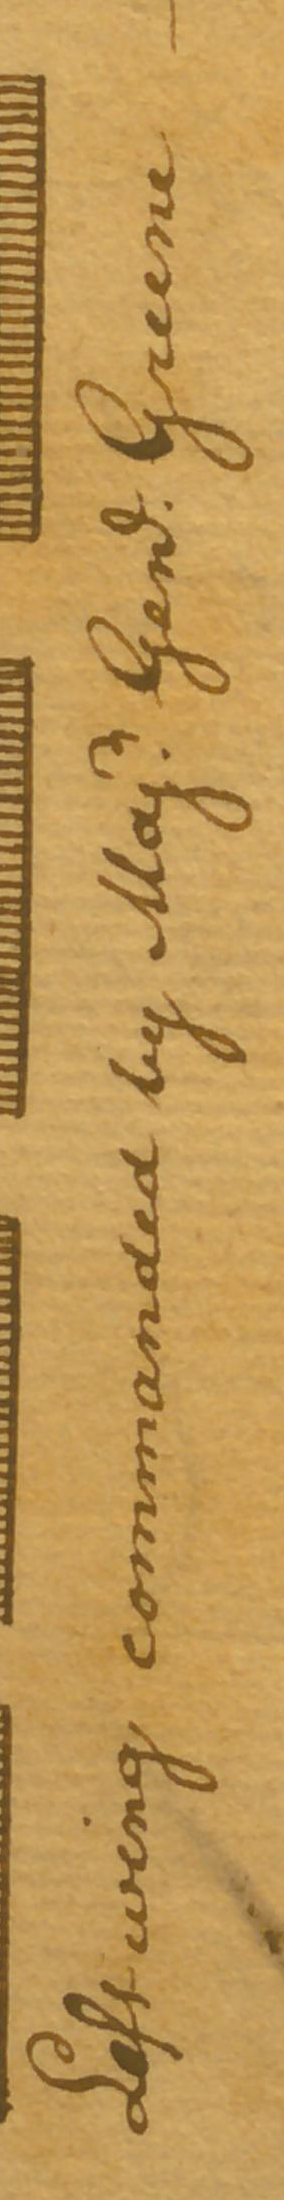Left wing commanded by Maj^r. Gen^l. Greene
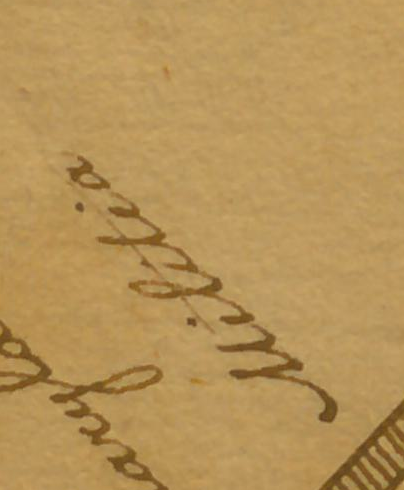Militia
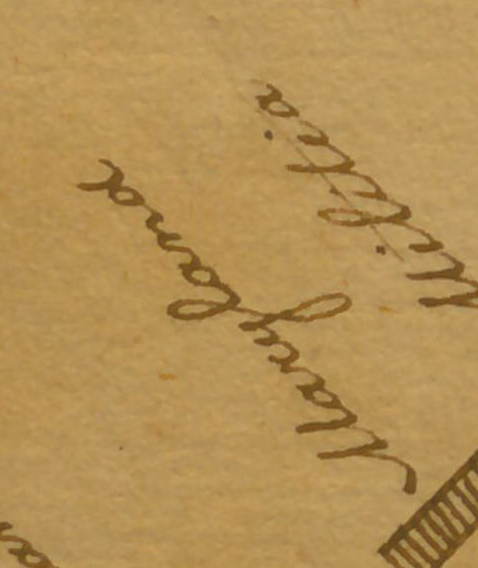Maryland
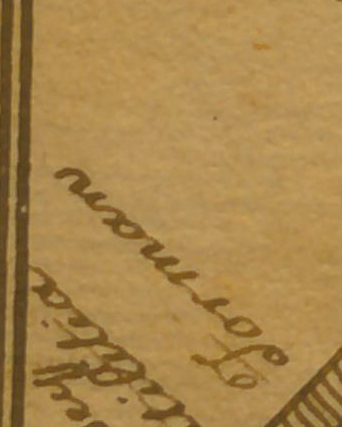Forman
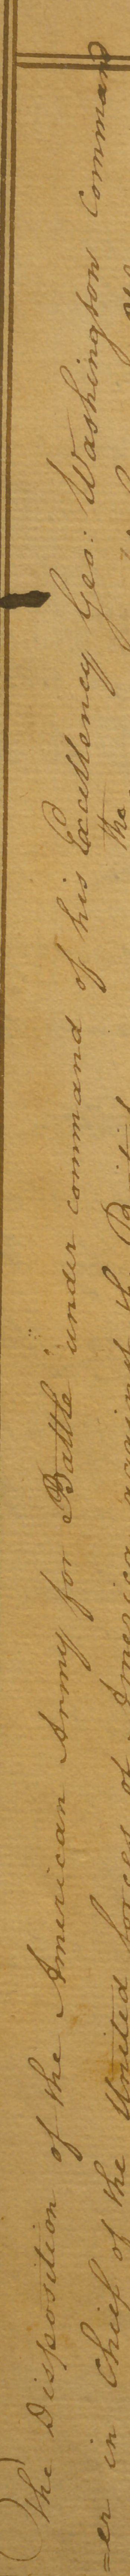The Disposition of the American Army for Battle under command of his Excellency Geo: Washington Command
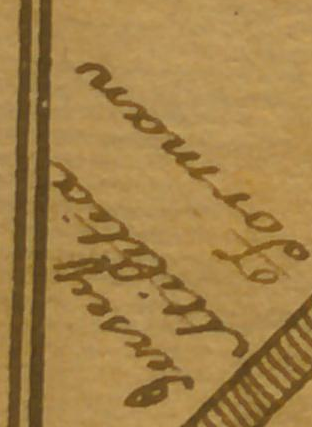Militia
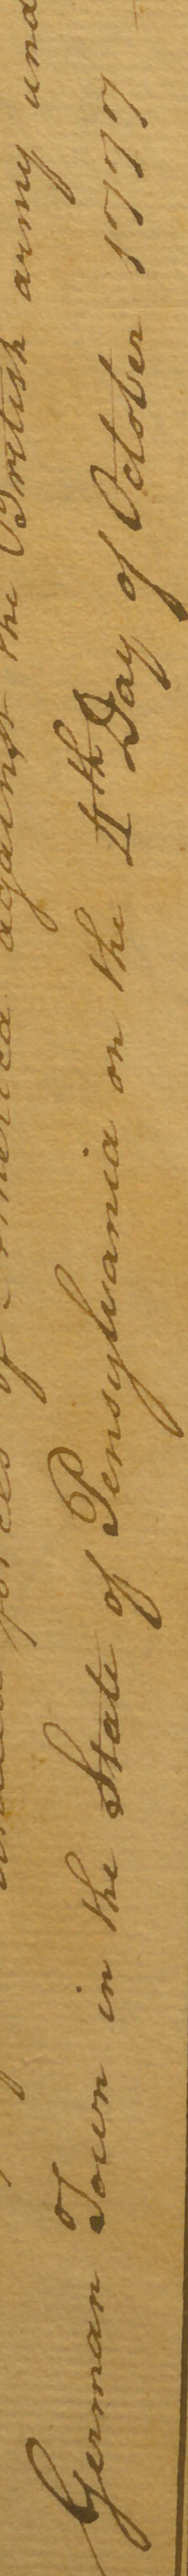German Town in the State of Pennsylvania on the 11^th Day of October 1777
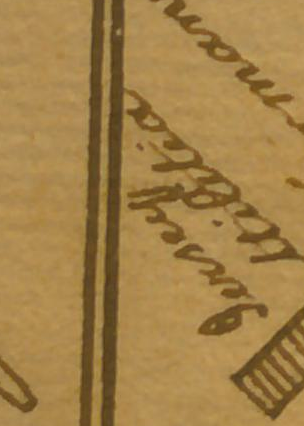Jersey
